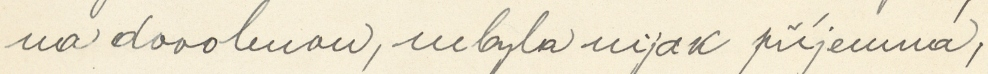na dovolenou, nebyla nijak příjemná,
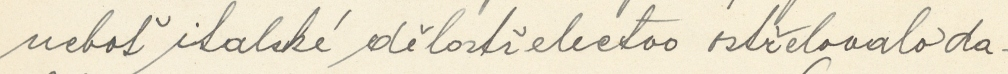neboť italské dělostřelectvo ostřelovalo da-
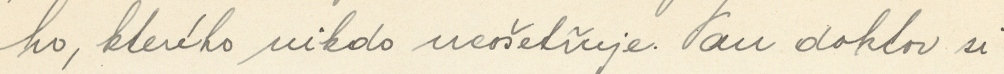ho, kterého nikdo neošetřuje. Pan doktor si
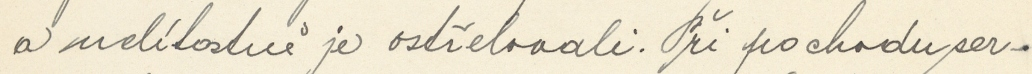a nelítostně je ostřelovali. Při pochodu ser-
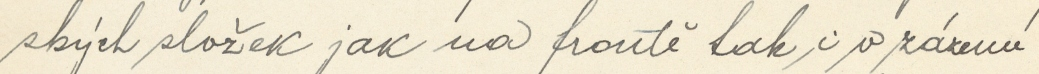ských složek jak na frontě tak i v zázemí
